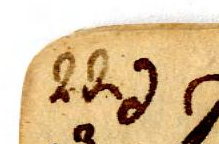22
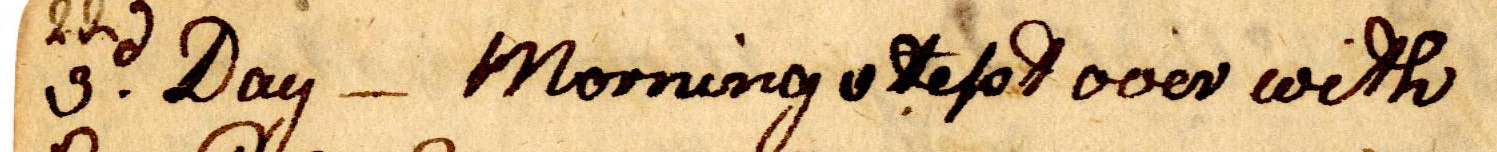3^d Day- Morning stept over with
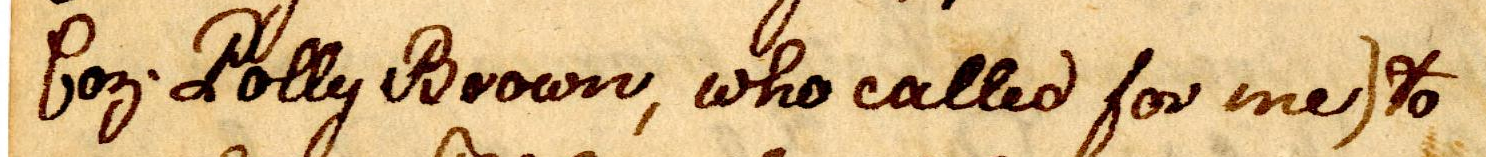Coz. Polly Brown, who called for me) to
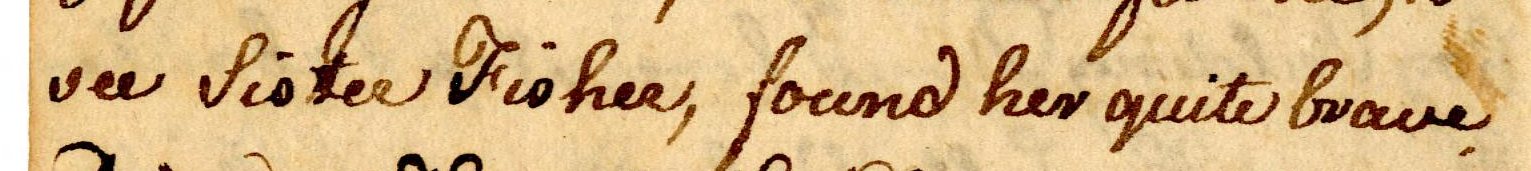see Sister Fisher, found her quite brave
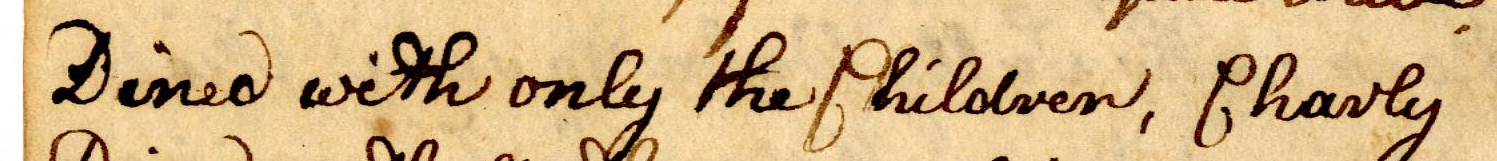Dined with only the Children, Charly
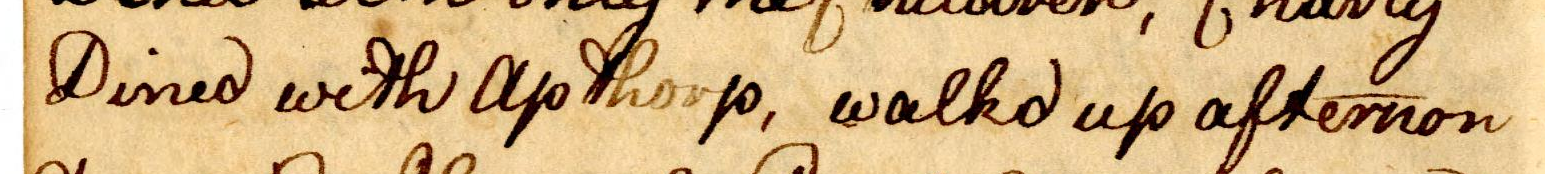Dined with Apthorp, walkd up afternon
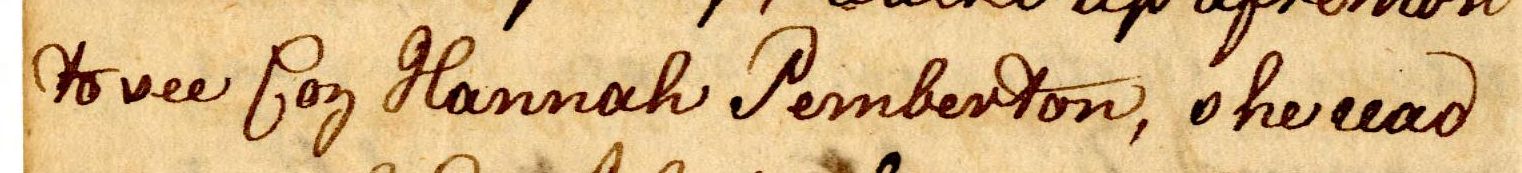to see Coz Hannah Pemberton, she read
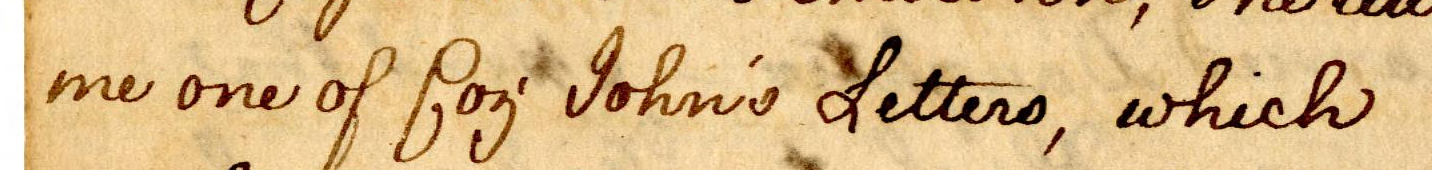me one of Coz John's Letters, which
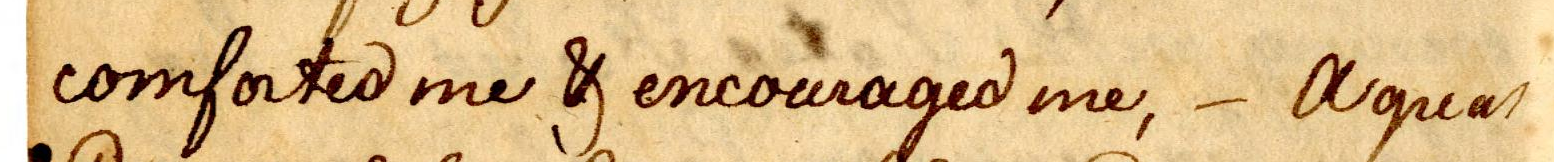comforted me & encouraged me.- A great
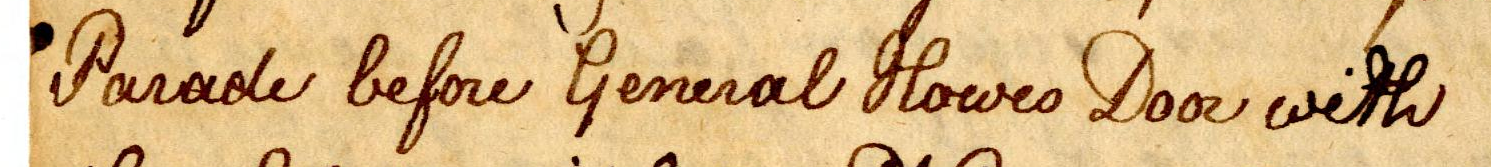Parade before General Howes Door with
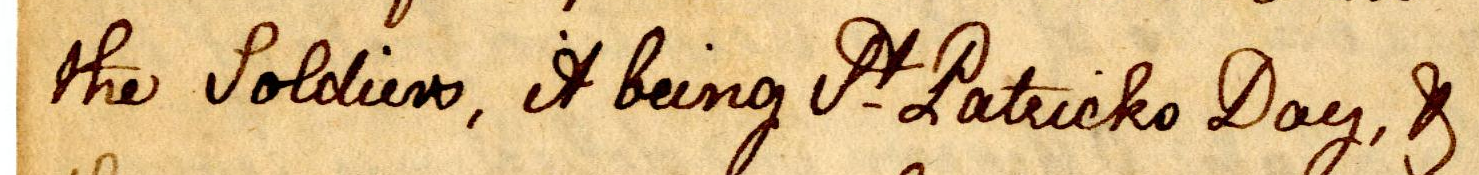the Soldiers, it being S^t. Patricks Day, &
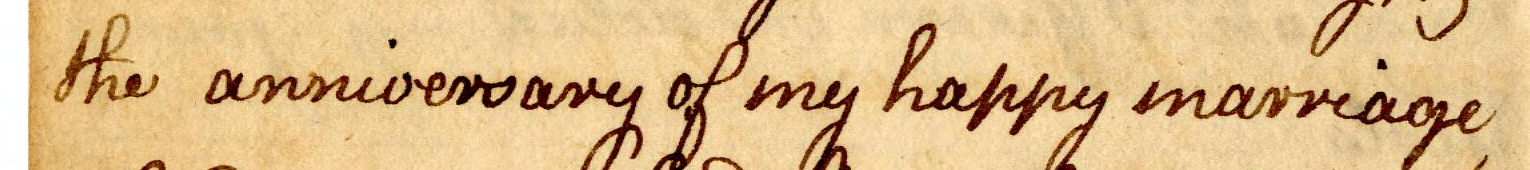the anniversary of my happy marriage,
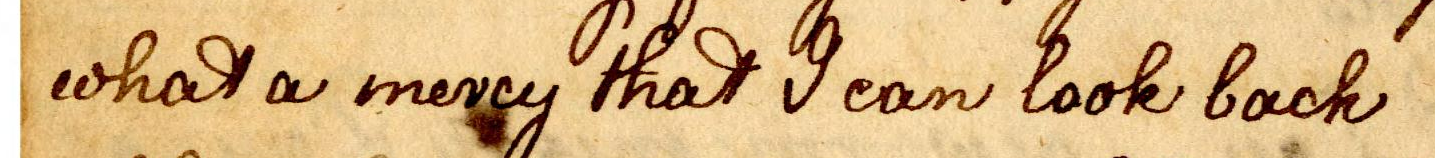what a mercy that I can look back
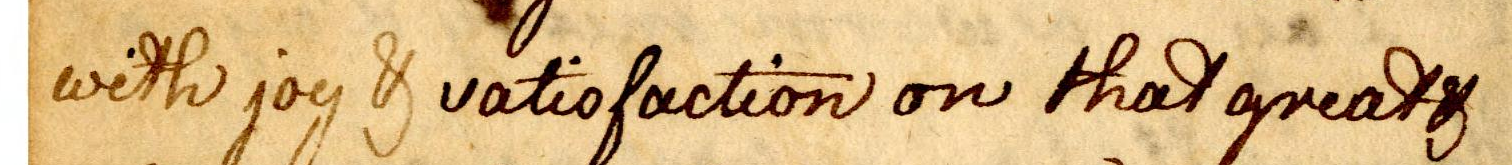with joy & satisfaction on that great &
